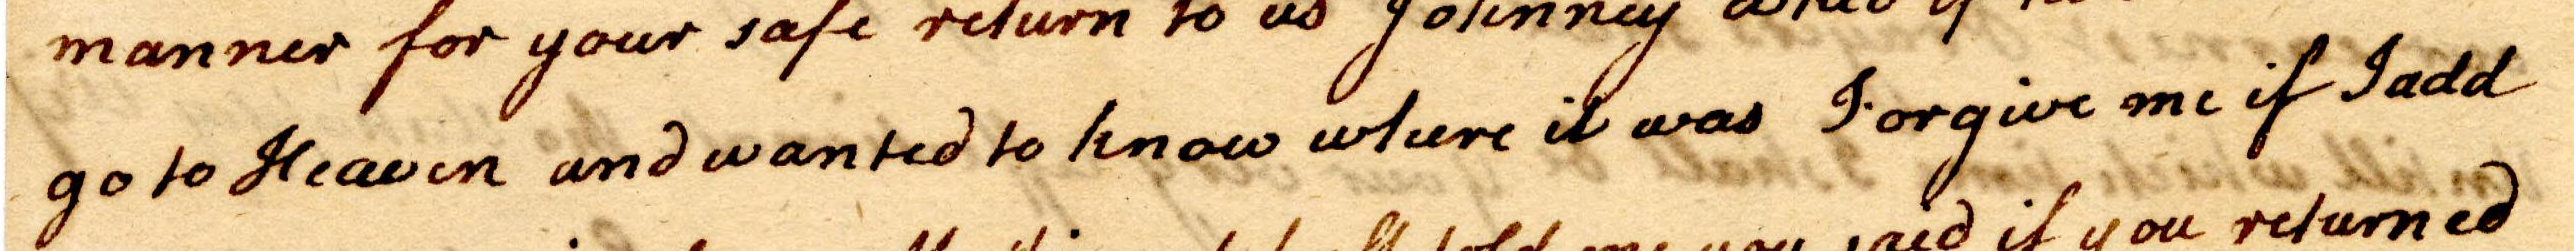go to Heaven and wanted to know where it was Forgive me if I add
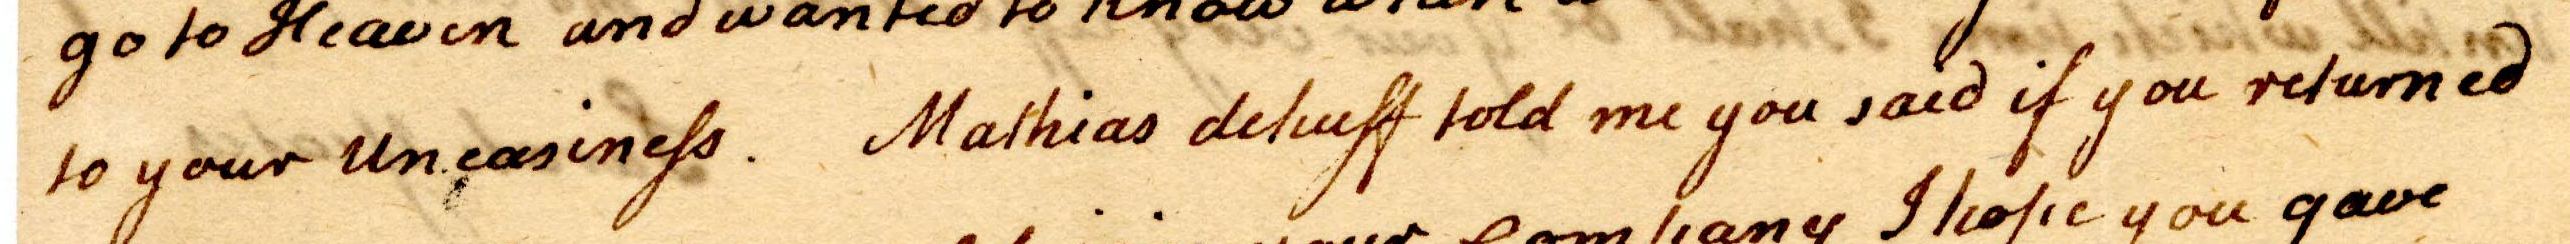to your Uneasiness. Mathias dearest told me you said if you returned
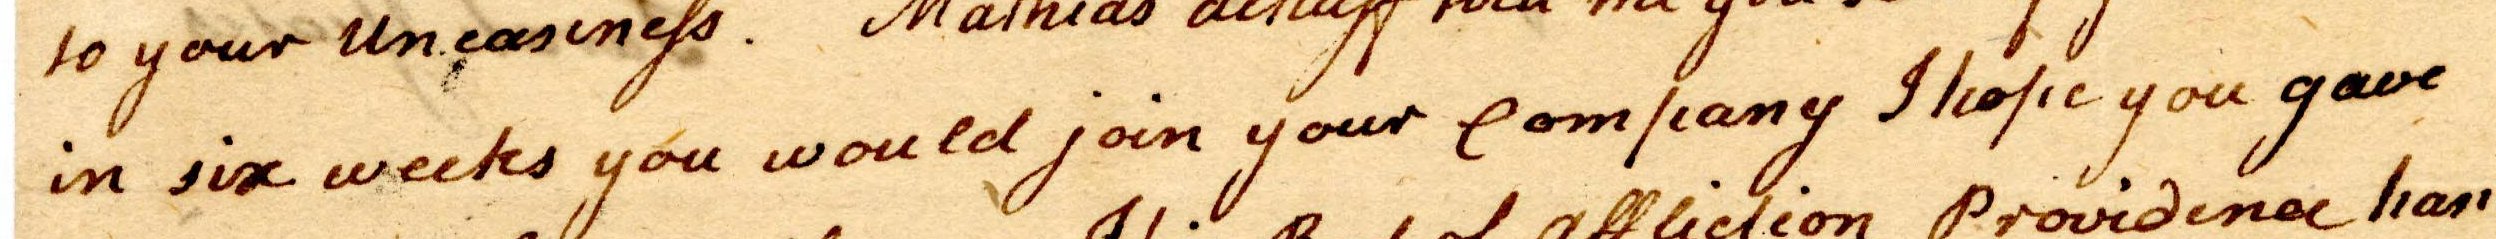in six weeks you would join your Compiany I hope you gave
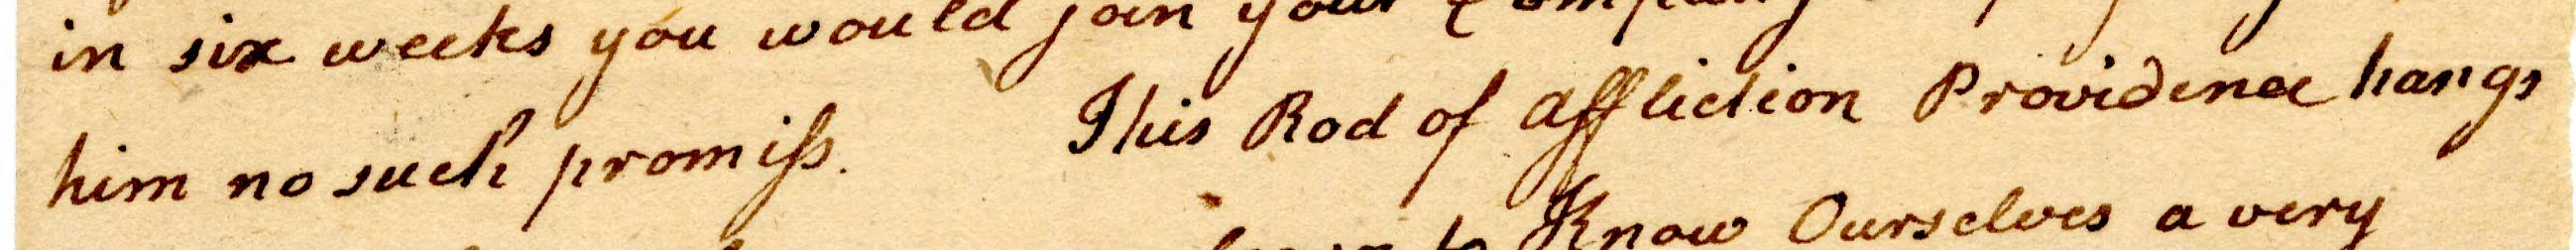him no such promiss. This Rod of affliction Providence hangs
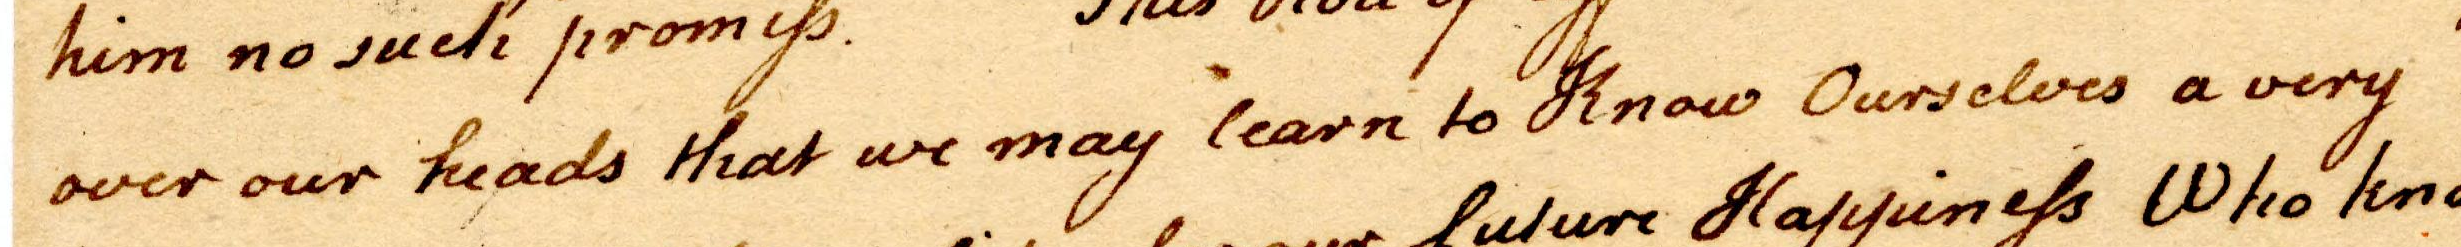over our heads that we may learn to Know Ourselves a very
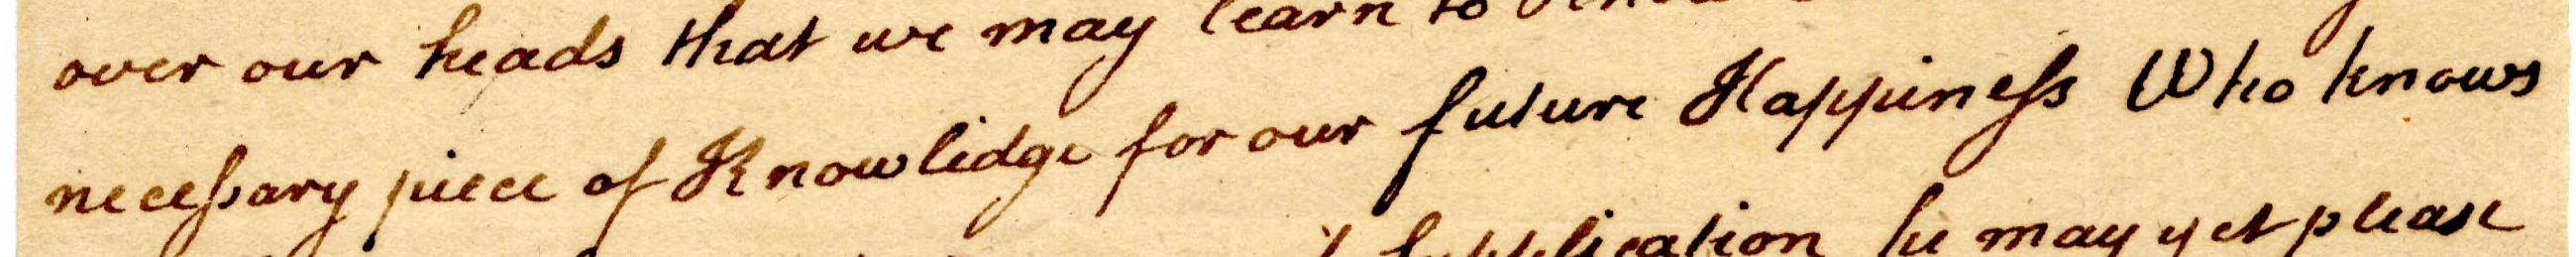necessary piece of Knowlidge for our future Happiness Who knows
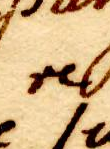re
